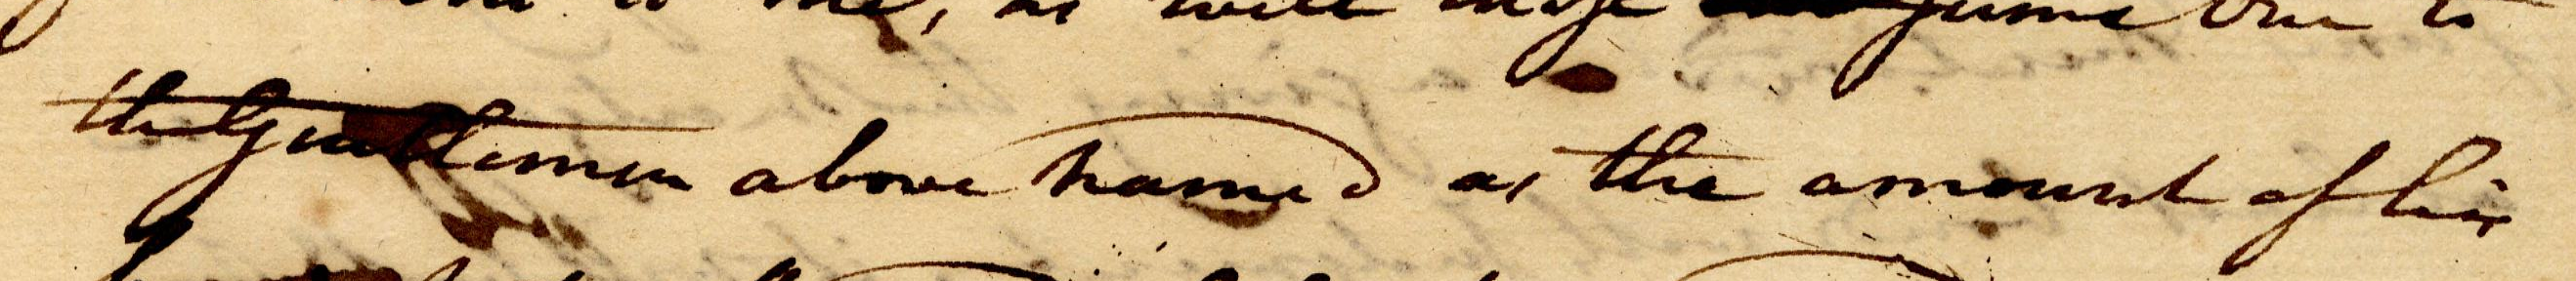the Gentlemen above named as the amount of his
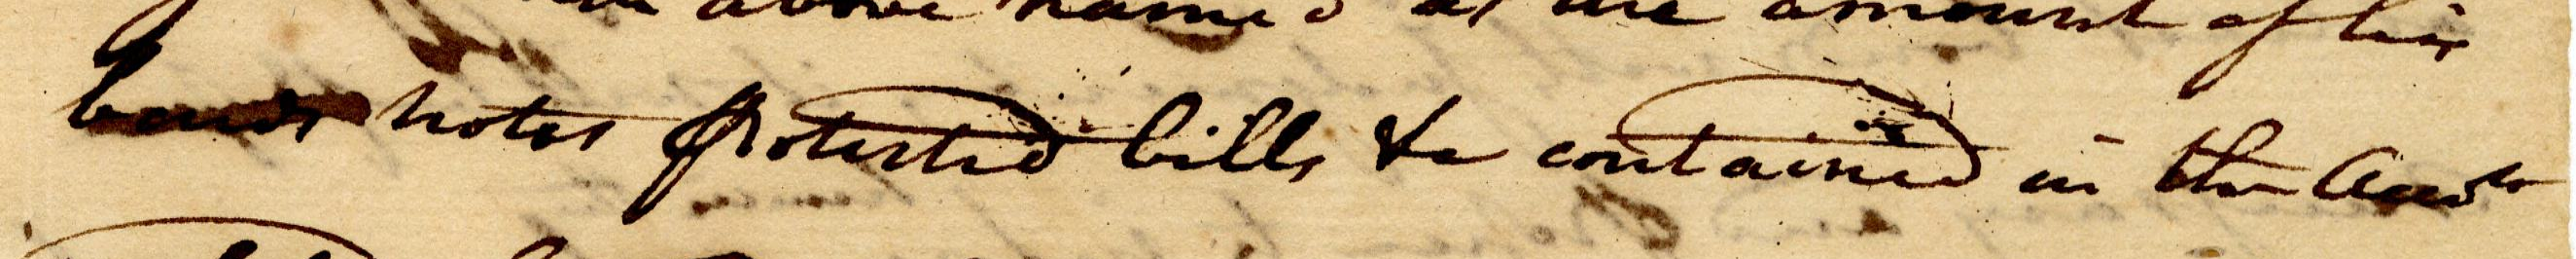[____] notes bills & contained in the Acco^ts
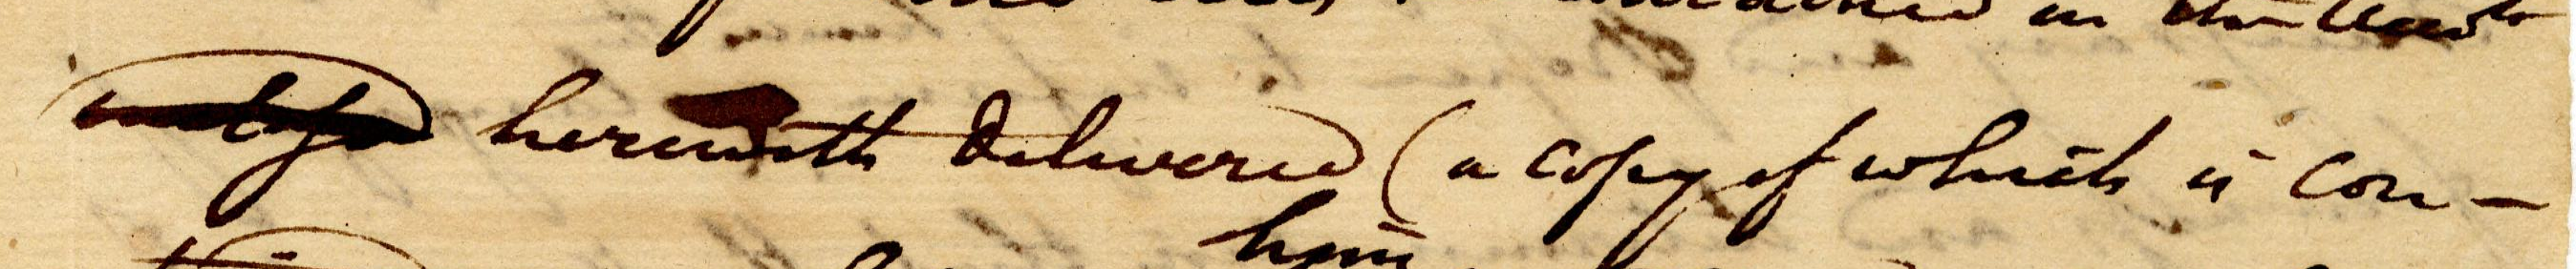[enclosed] henceforth delivered (a copy of which is con-
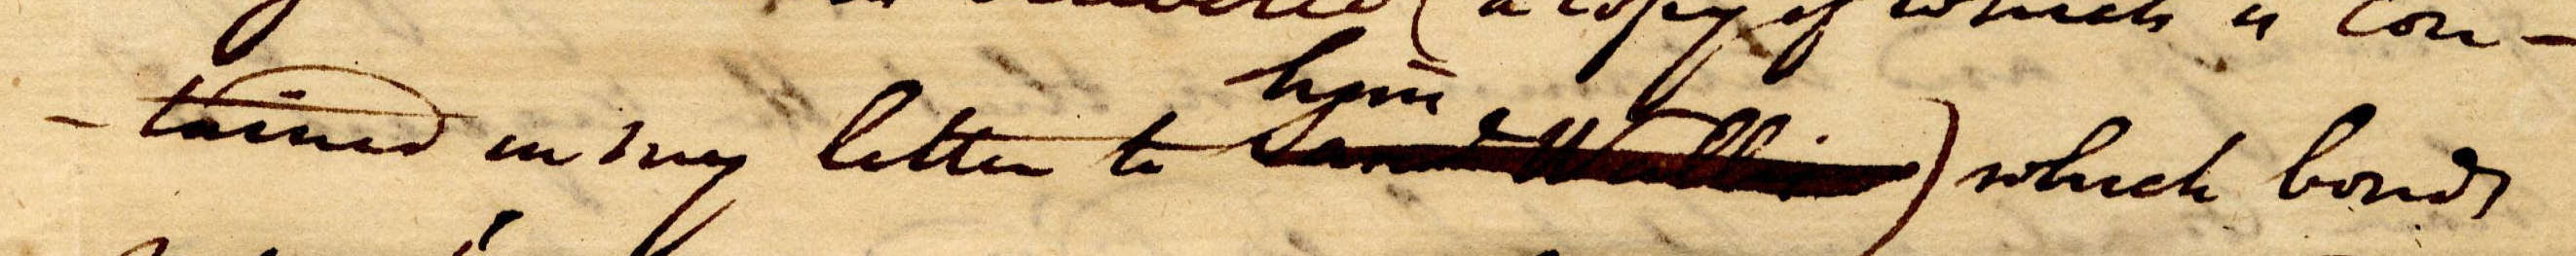-tained in my letter to [Sam^l. Wallin]) which bond
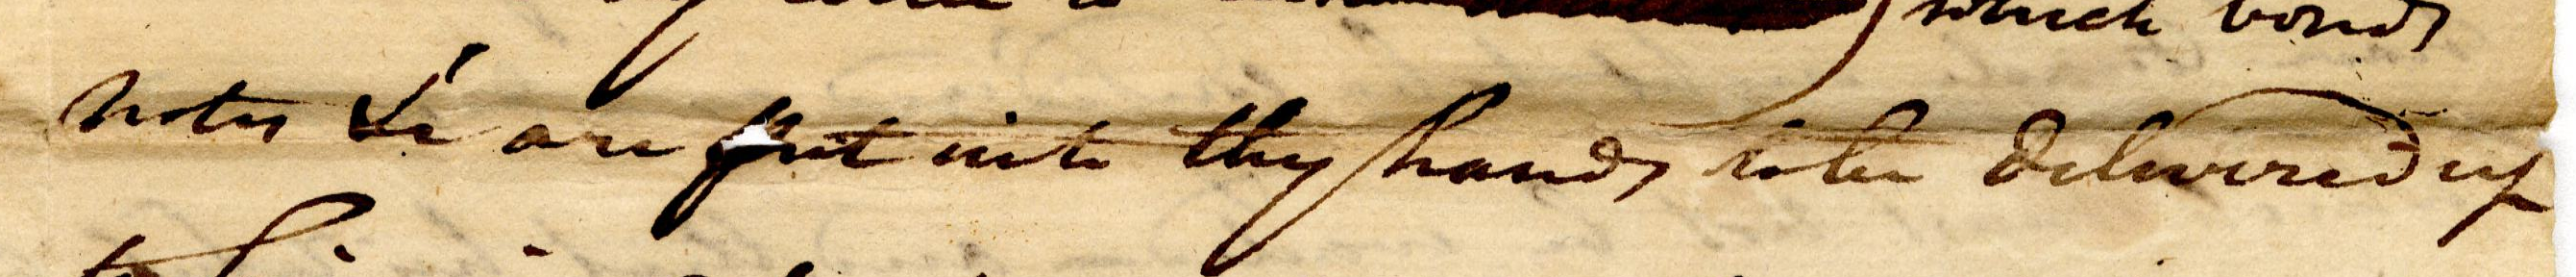notes &c are put into thy hands to be delivered up
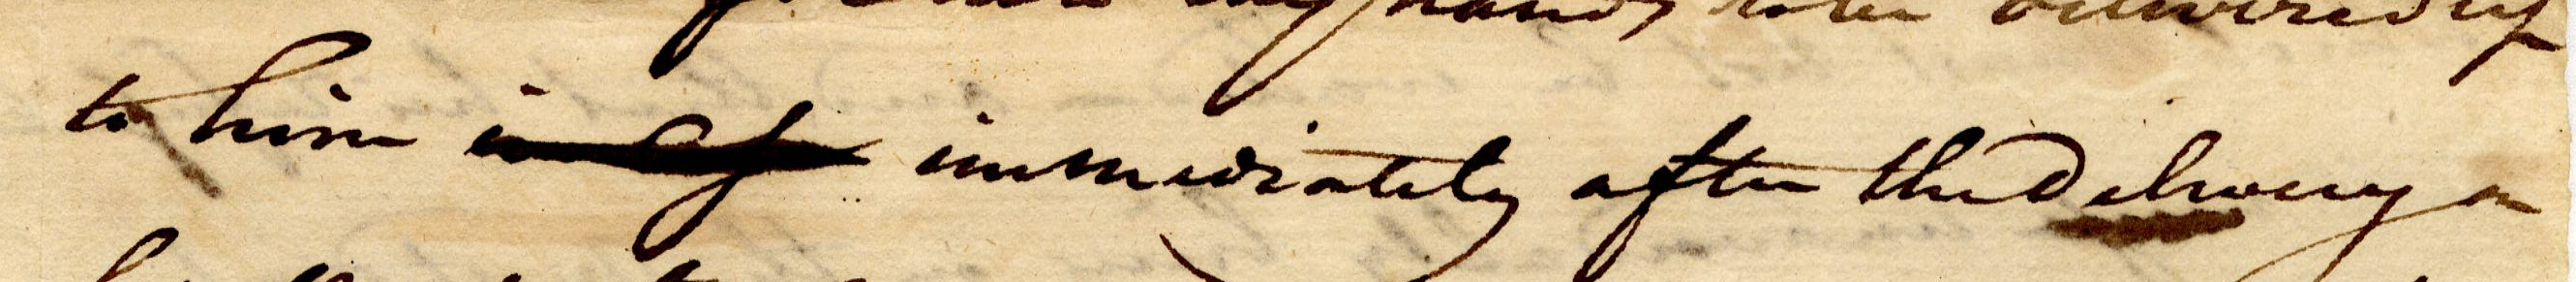to him [______] immediately after the delivery on
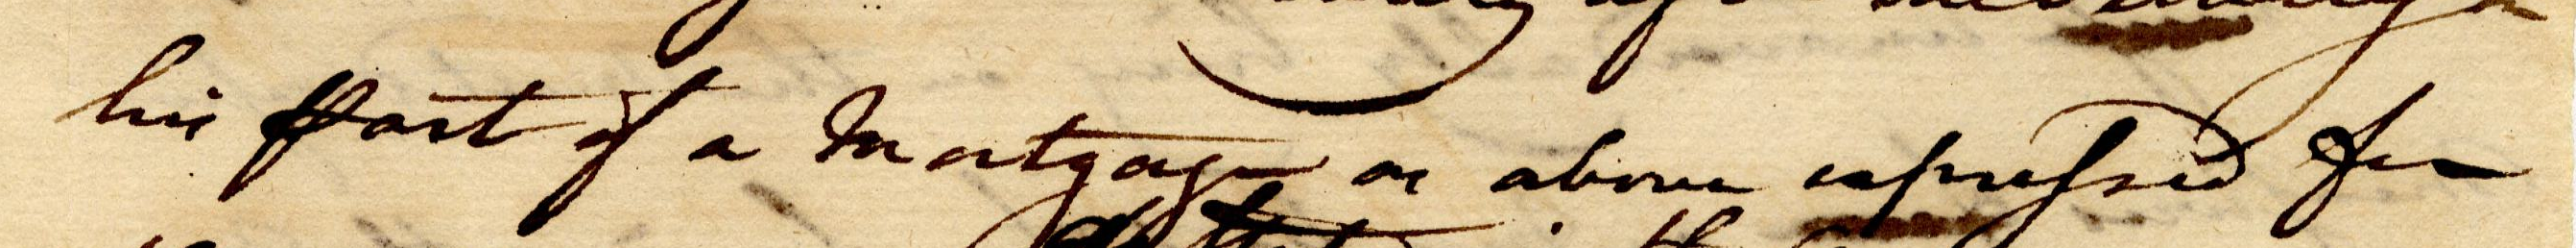his part of a mortgage or above is pressed for
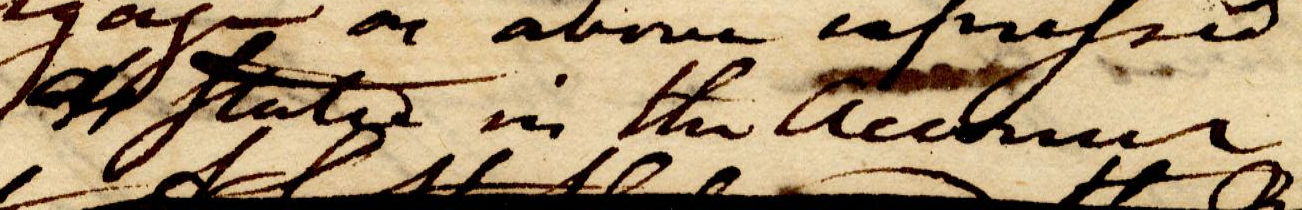as stated in the account
